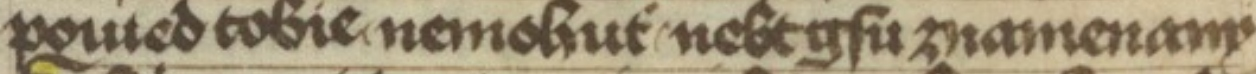pouied tobie nemohuṫ nebt gſu znamenany
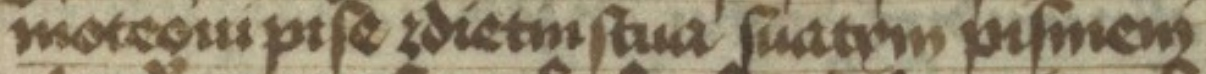moteoui piẛe zdietinſtua ſuatym piſmem
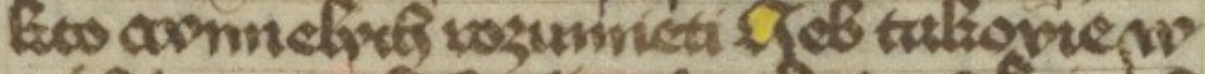kto wvmielych rozumieti Neb takovie w
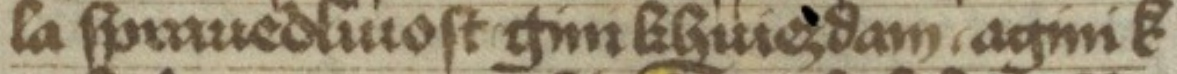la ſprauedliuoſt gini khuiezdam agini k
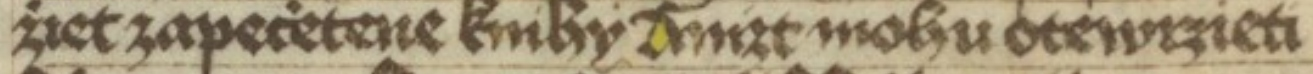żiet zapeċetene knihy Anizt mohu otewrzíeti
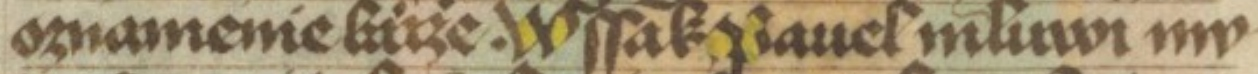oznamenie kṙiże. Wſſak Pauel mluwi mv-
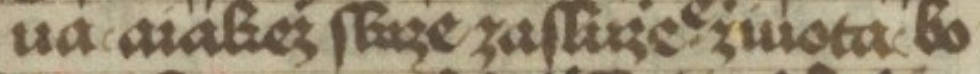ua, aiakeż ſkrze zaſluże e żiuota bo
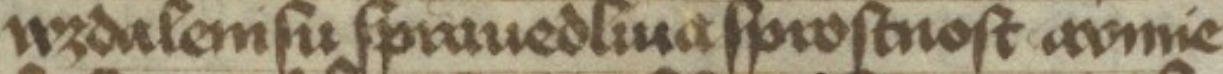wzdaleniſu ſprauedliua ſproſtnoſt, avmie-
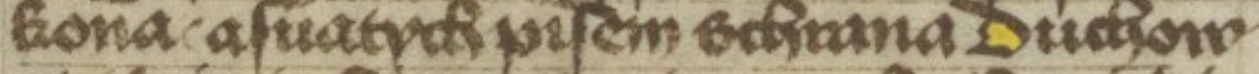kona a ẛuatych piſem ochrana Duchow-
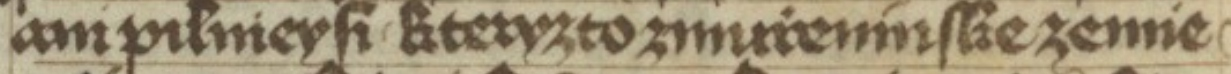ani pilnieyẛi kteryzto zmuṙenínſke zemie
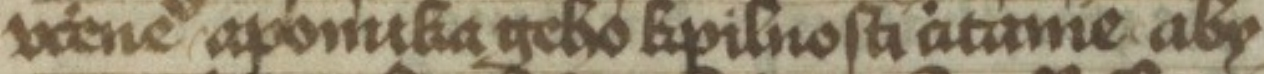vċenev aponuka geho kpilnoſti ċitanie aby
